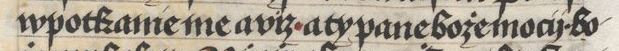wpotkaníe me a viz.a ty pane boże mocij.bo¬
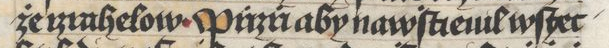że izrahelow.Pṙizṙi aby nawẛtieuil wſyec¬
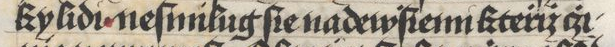ky lidi.neſmilug ſie nadewẛiemi kteṙiż cżi¬
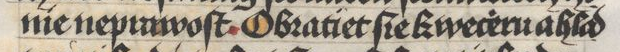ne neprawoſt.Obratiet ſie kweċeru a hlad
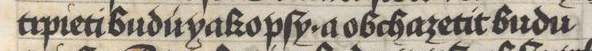trpieti budú yako pſy.a obchazetit budu
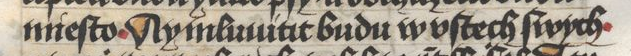mieſto.Ay mluuitit budu w vſtech ſwych.
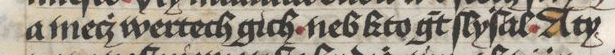a mecż wertech gich.neb kto ḡt ſlyẛal.A ty
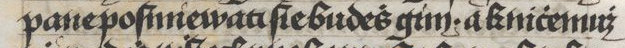pane poſmiewati ſie budeṡ gim.a kniċemuż
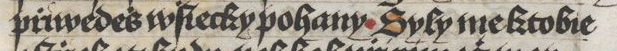pṙiwedeṡ wẛiecky pohany.Syly me ktobie
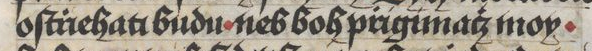oſtṙiehati budu.neb boh pṙígímacż moy.
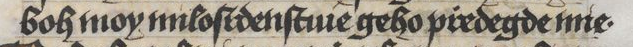boh moy miloſrdenſtuíe geho pṙedegde mie.
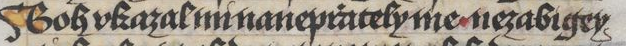Boh vkazal mi nanepṙately me.nezabigey
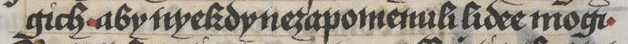gich.aby nyekdy nezapomenuli lidee mogi.
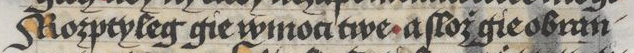Rozptyleg gie wmoci twe.a ſlož gie obran¬
